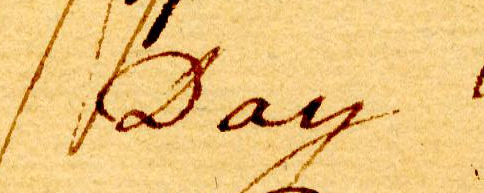Day
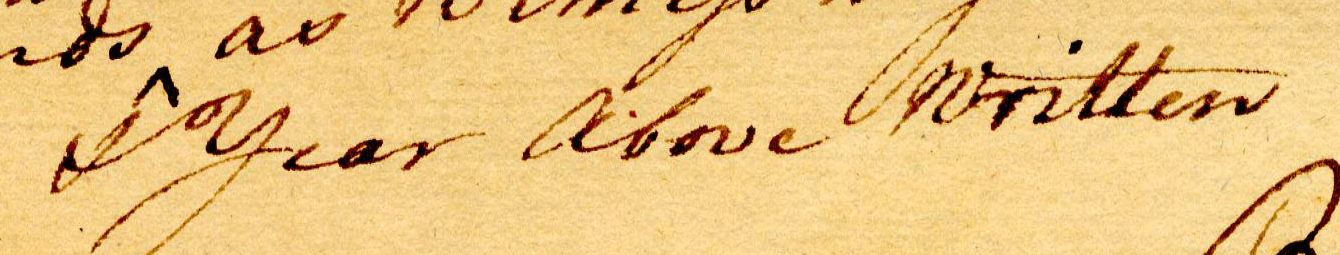& year above written
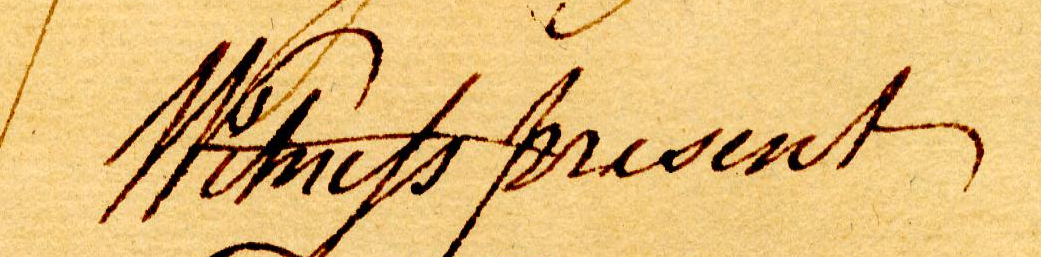Witness present
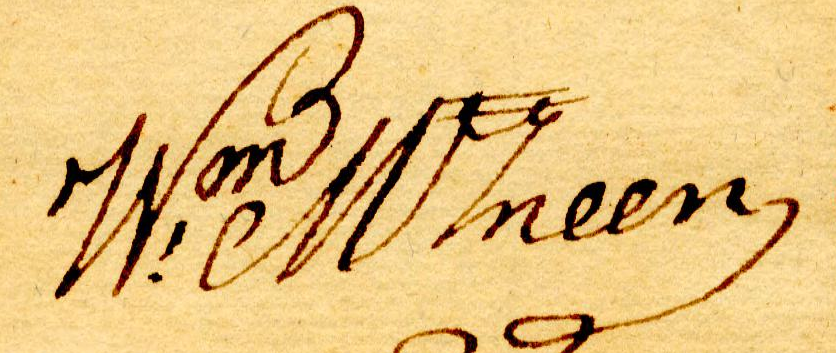W^m. M^cneen
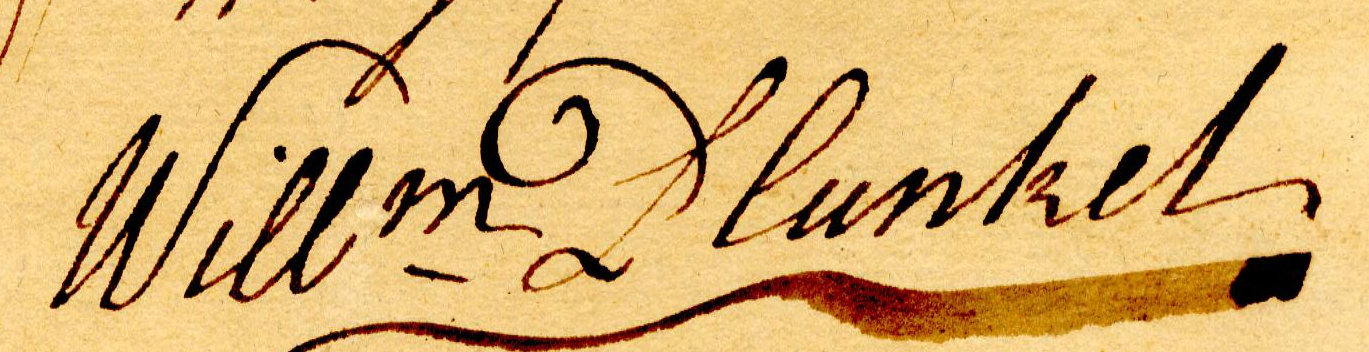Will^m Plunket
